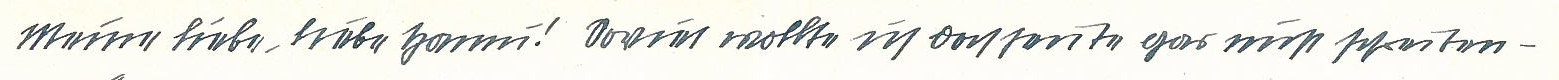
Meine liebe, liebe ! Soviel wollte ich doch heute gar nicht schreiben –
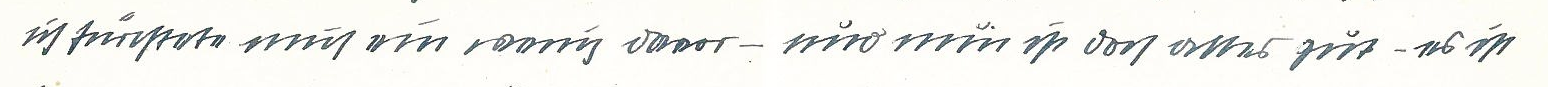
ich fürchtete mich ein wenig davor – und nun ist doch alles gut – es ist
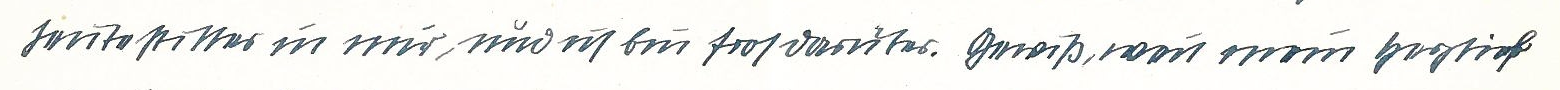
heute stiller in mir, und ich bin froh darüber. Gewiß, weil mein Herzlieb
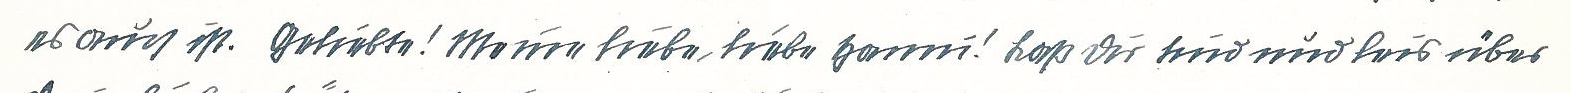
es auch ist. Geliebte! Meine liebe, liebe . Laß Dir lind und leis über
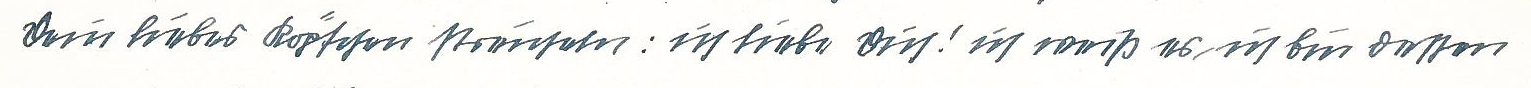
Dein liebes Köpfchen streichen: ich liebe Dich! ich weiß es, ich bin dessen
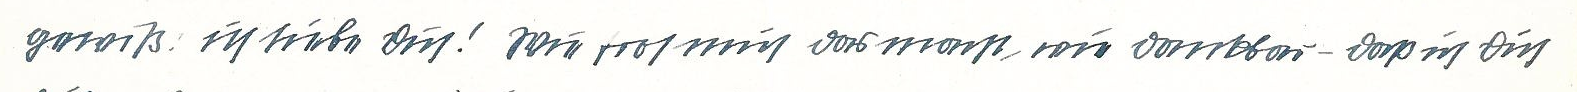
gewiß: ich liebe Dich! Wie froh mich das macht, wie dankbar – daß ich Dich
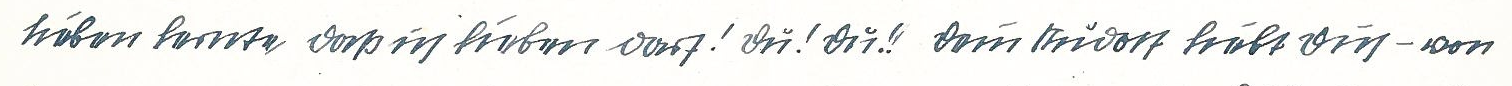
lieben lernte, daß ich Dich lieben darf! Du! Du!! Dein Rudolf liebt Dich – von
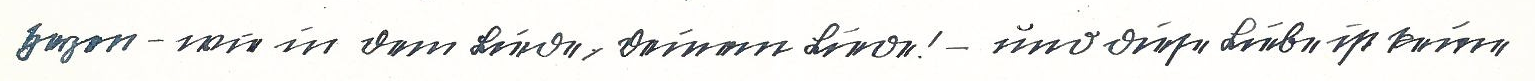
Herzen – wie in dem Liede, Deinem Liede! – und diese Liebe ist keine
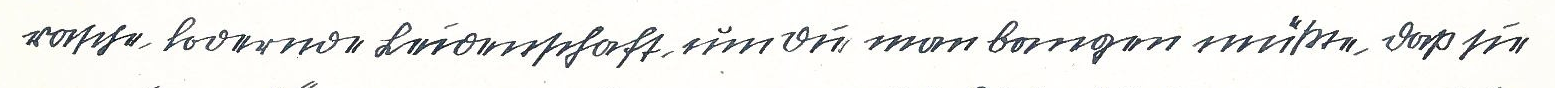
rasche, lodernde Leidenschaft, um die man bangen müßte, daß sie
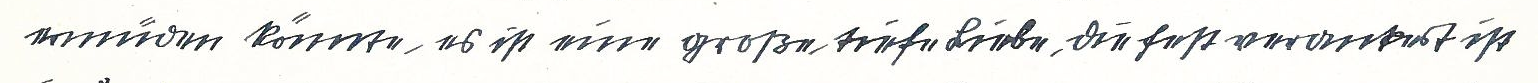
ermüden könnte, es ist eine große, tiefe Liebe, die fest verankert ist
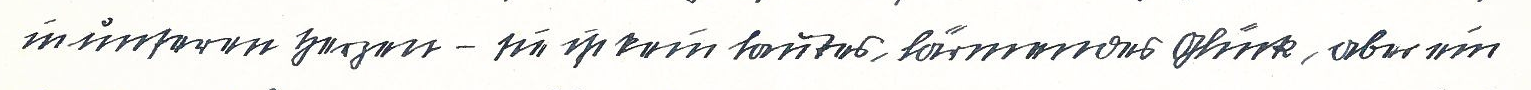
in unseren Herzen – sie ist kein lautes, lärmendes Glück, aber ein
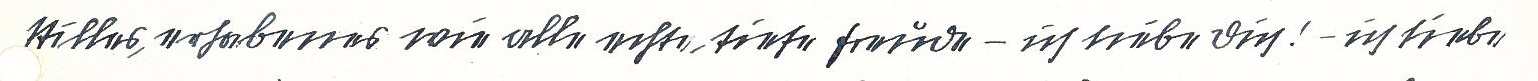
tilles, erhabenes wie alle echte, tiefe Freude – ich liebe Dich! – ich liebe
